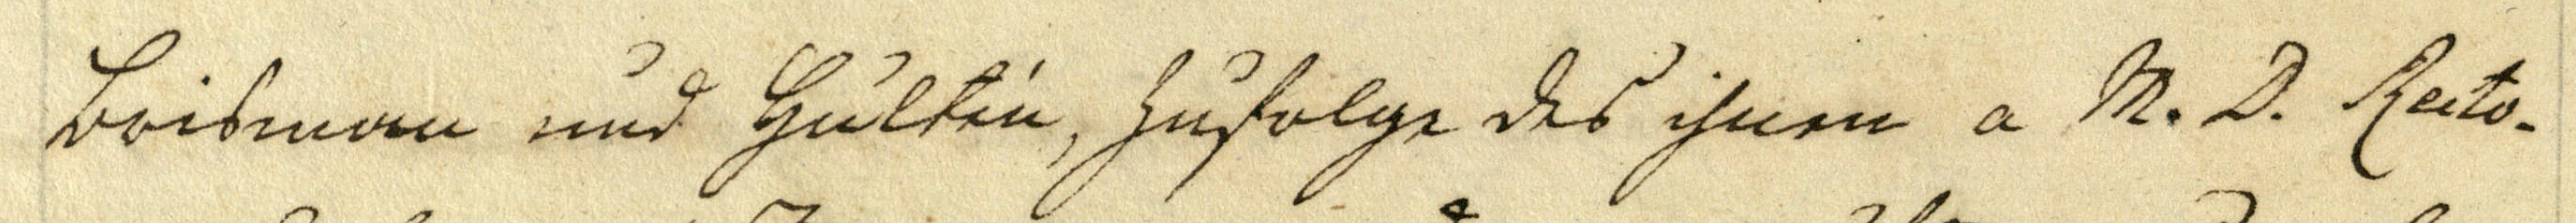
Brisman und Hultèn, Zufolge des ihnen a M. D. Recto¬
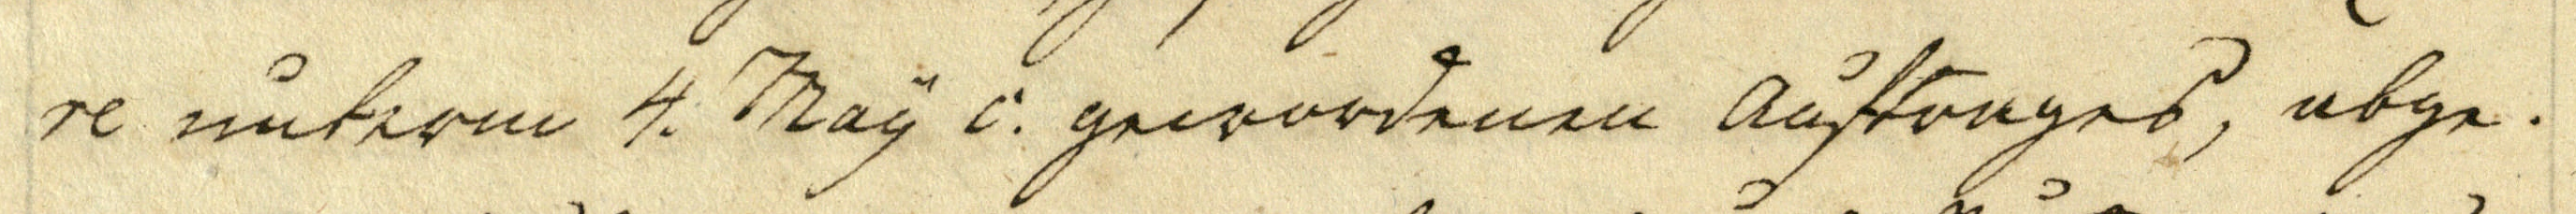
re unterm 4. Maÿ c. gewordenen Auftrages, abge¬
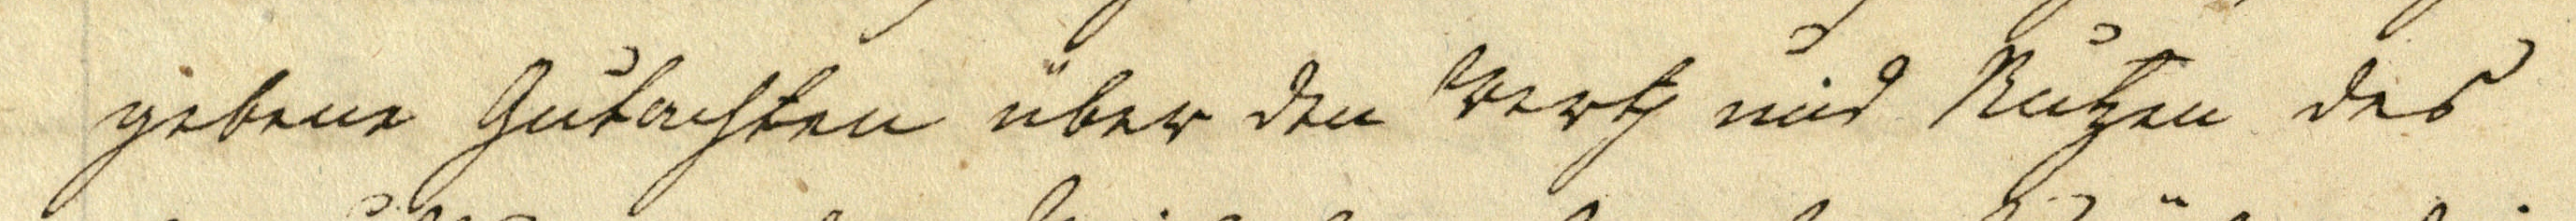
gebene Gutachten über den Werth und Nutzen des
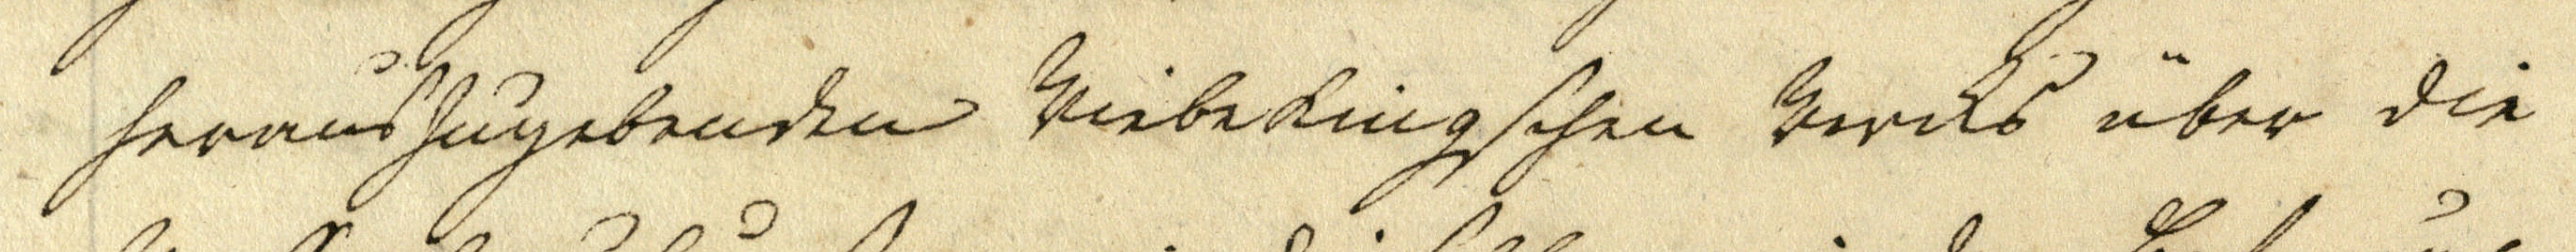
herauszugebenden Wiebekingschen Wercks über die
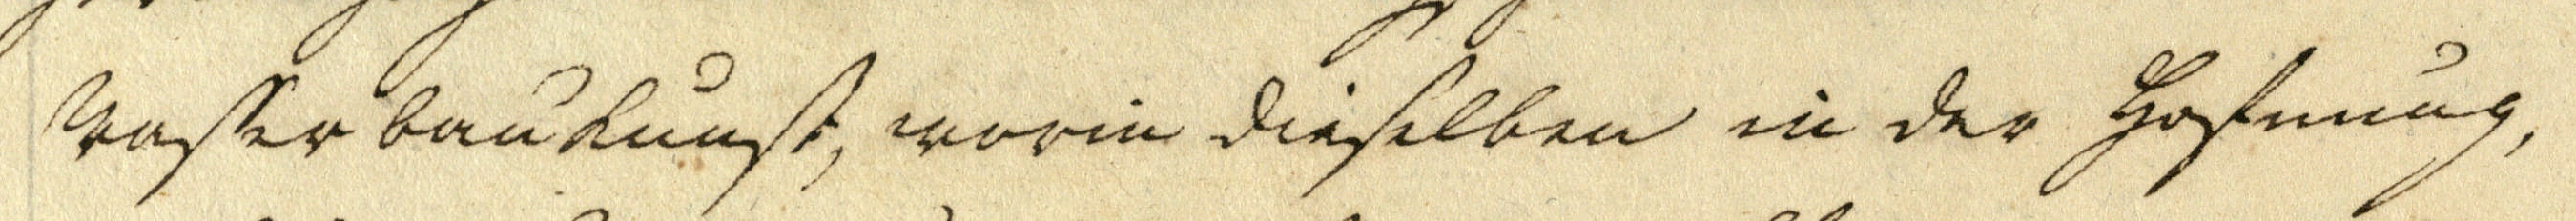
Wasserbaukunst, worin dieselben in der Hofnung,
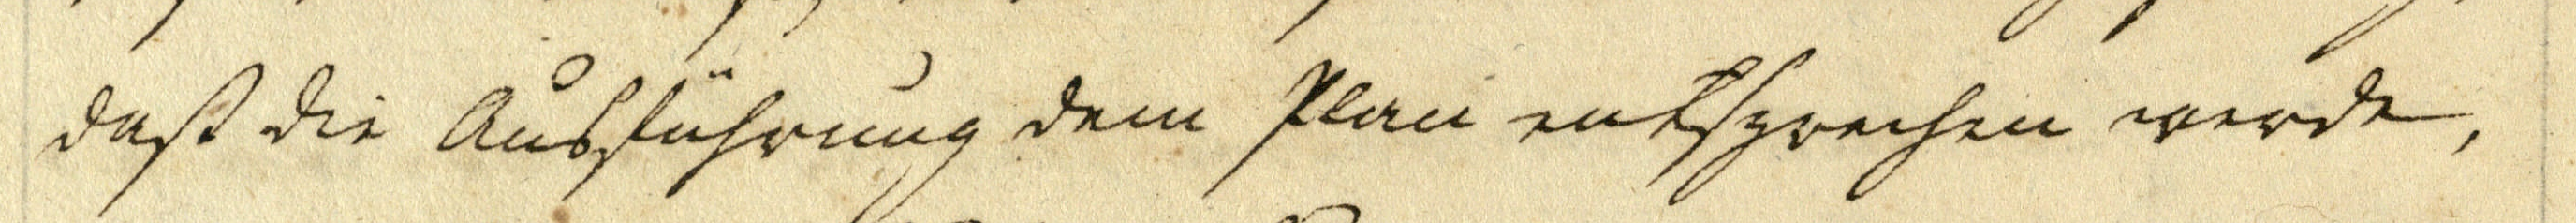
daß die Ausführung dem Plan entsprechen werde,
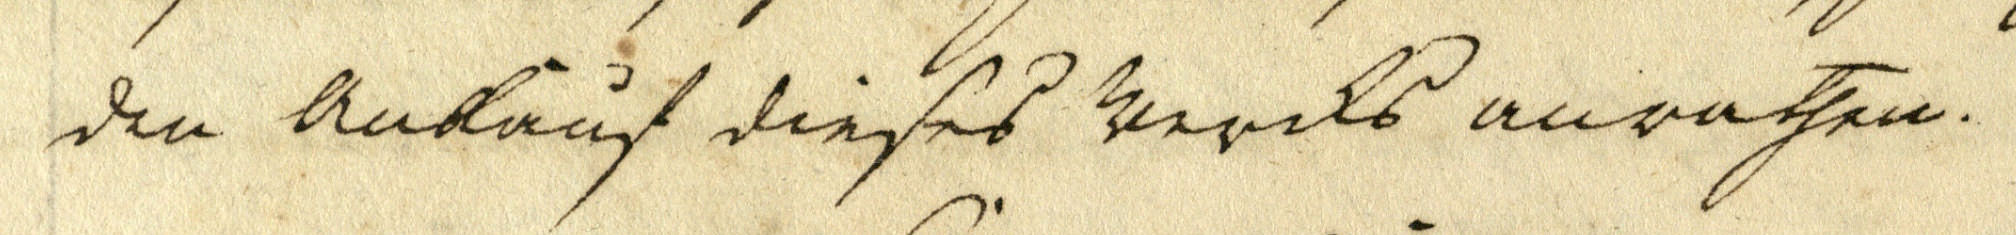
den Ankauf dieses Wercks anrathen.
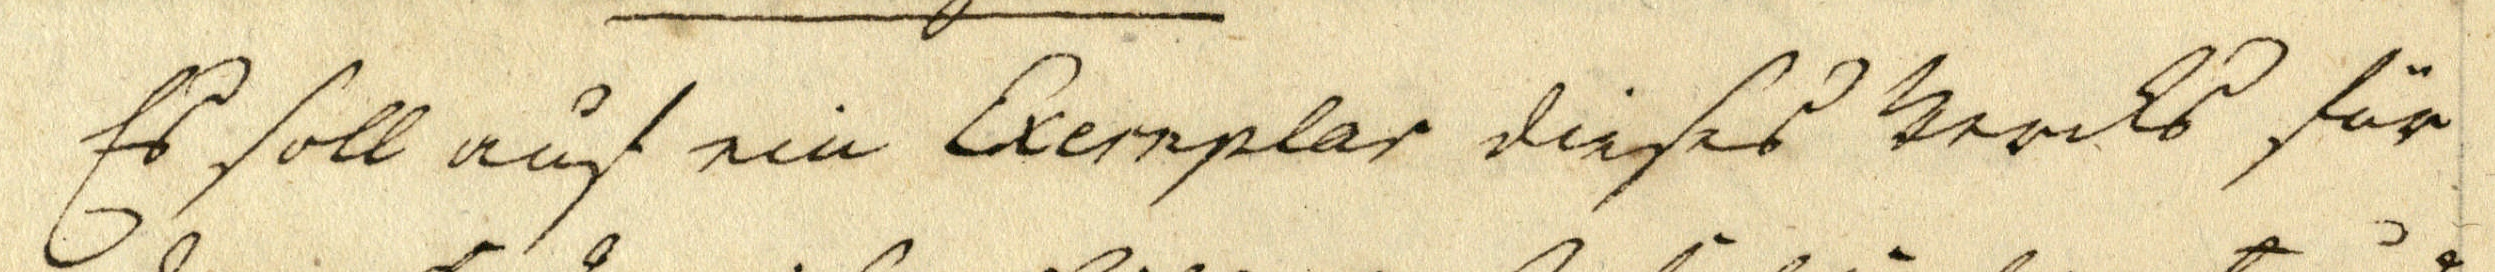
Es soll auf ein Exemplar dieses Wercks für
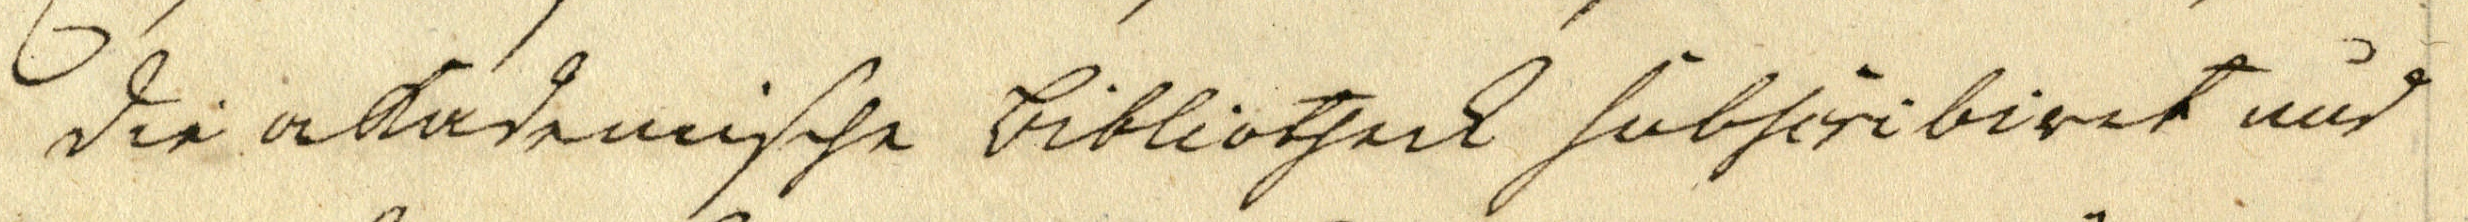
die akademische Bibliotheck subscribiret und
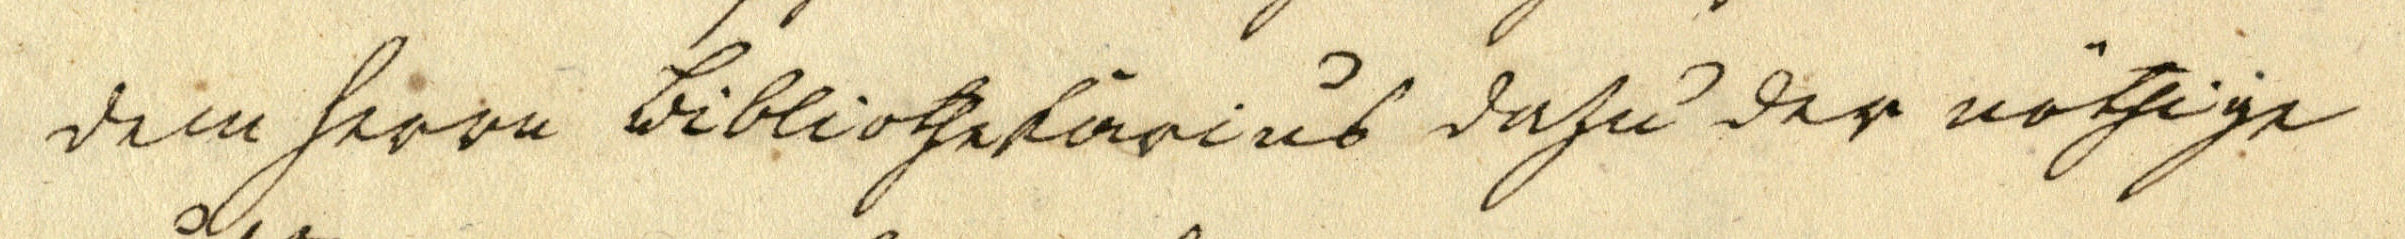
dem herrn Bibliothekarius dazu der nöthige
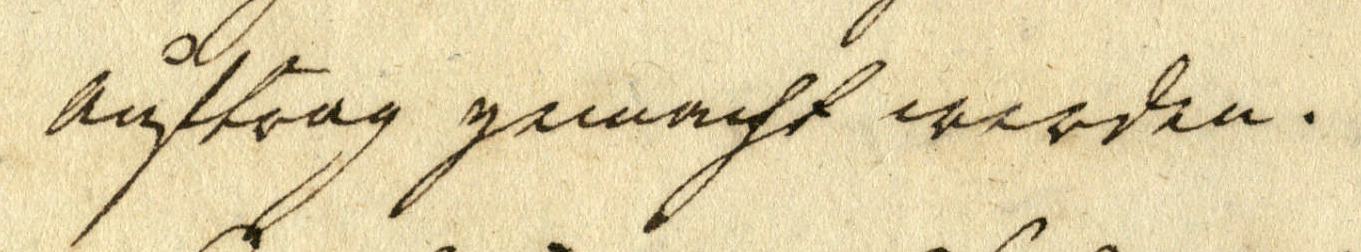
Auftrag gemacht werden.
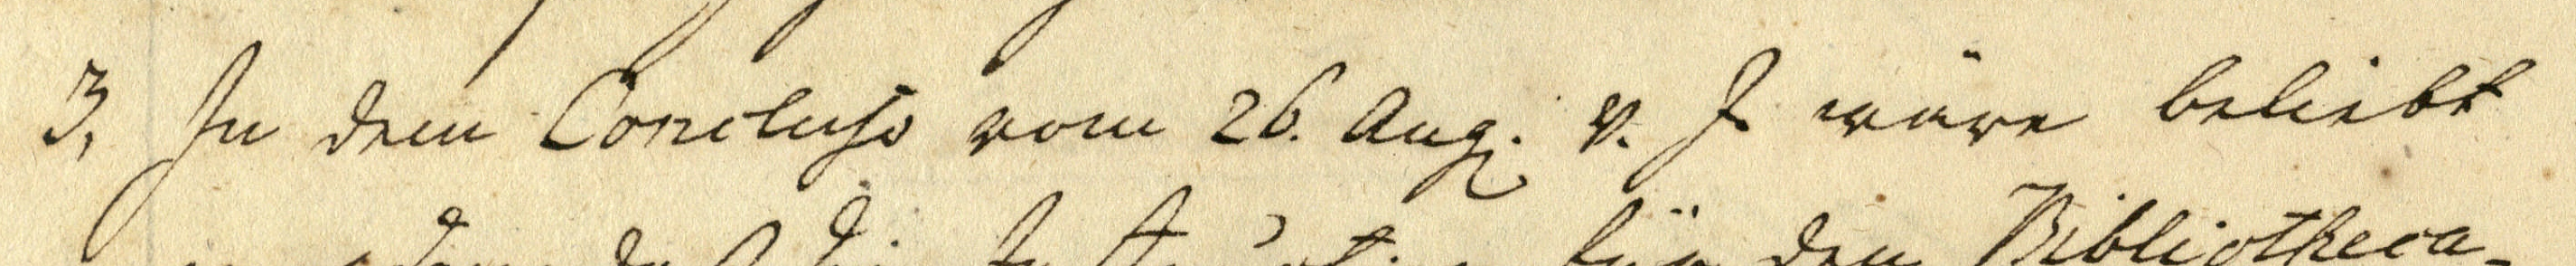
3. In dem Concluso vom 26. Aug. v. J. wäre beliebt
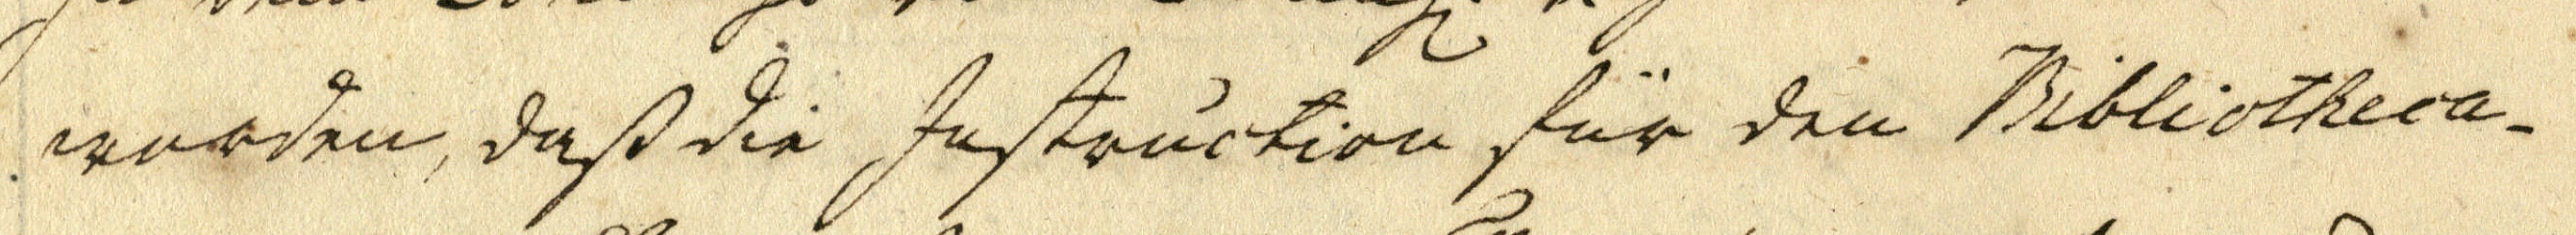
worden, daß die Instruction für den Bibliotheca¬
